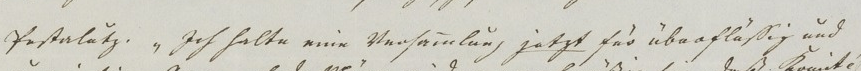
Pestalutz: «ich halte eine Versammlung jetzt für überflüssig und
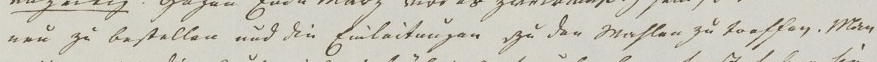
neu zu bestellen und die Einleitungen zu den Wahlen zu treffen. Man
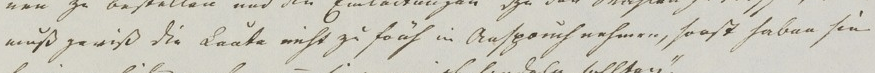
muß gewiß die Leute nicht zu früh in Anspruch nehmen, sonst haben sie
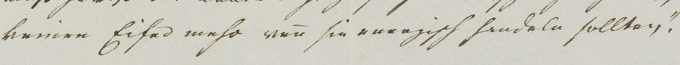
keinen Eifer mehr wenn sie energisch handeln sollten».
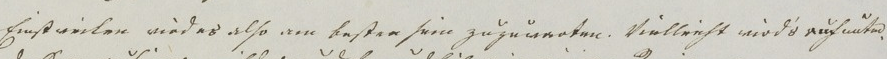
Einstweilen wird es also am besten sein zuzuwarten. Vielleicht wird's auch unter-
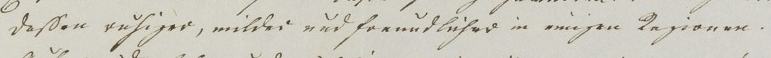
dessen ruhiger, milder und freundlicher in einigen Regionen.
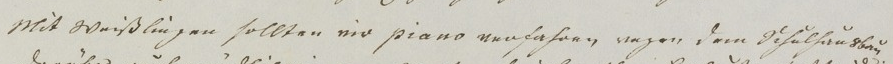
Mit Weißlingen sollten wir piano verfahren wegen dem Schulhausbau.
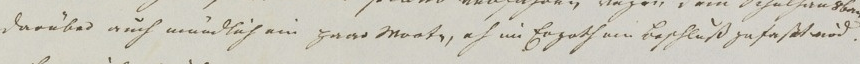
Darüber auch mündlich ein paar Worte, eh im Erzrth ein Beschluß gefaßt wird.
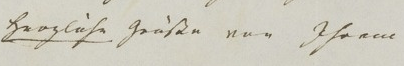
Herzliche Grüße von Ihrem:
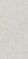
Joh.
